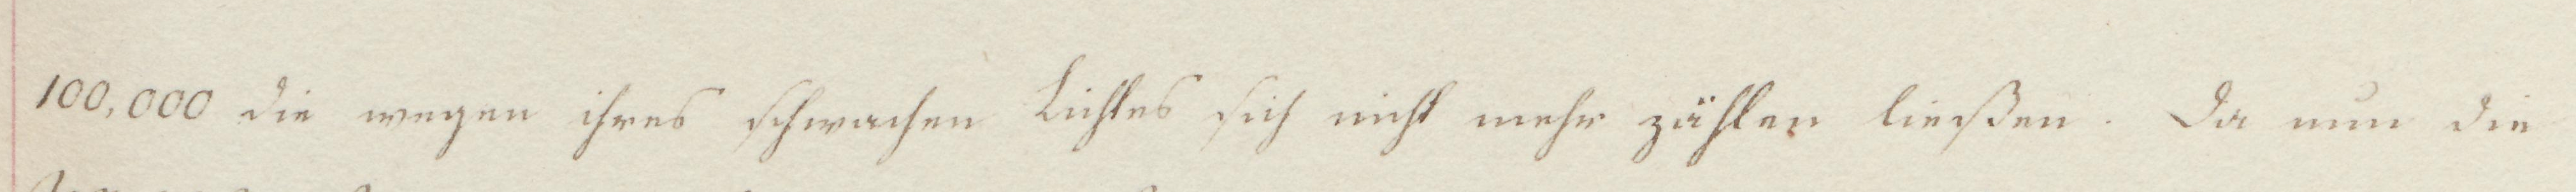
100,000 die wegen ihres schwachen Lichtes sich nicht mehr zählen ließen. Da nun die
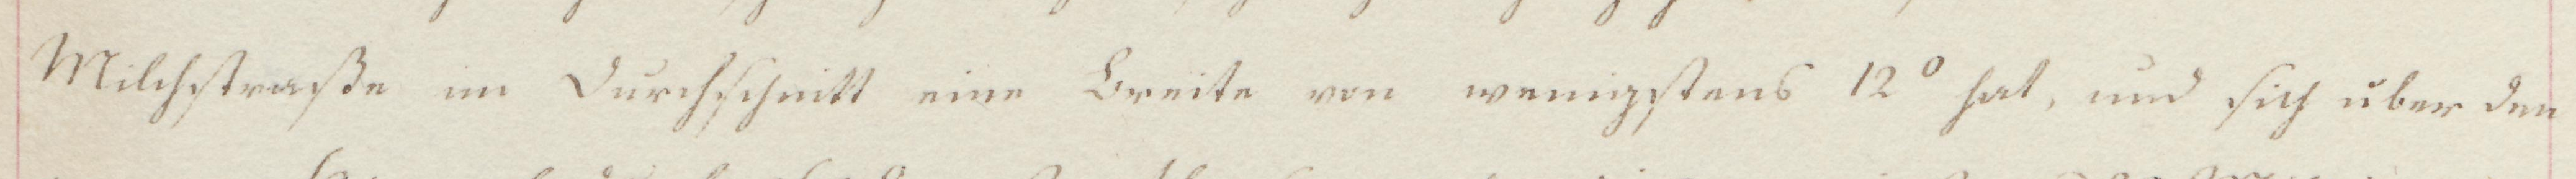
Milchstraße im Durchschnitt eine Breite von wenigstens 12° hat, und sich über den
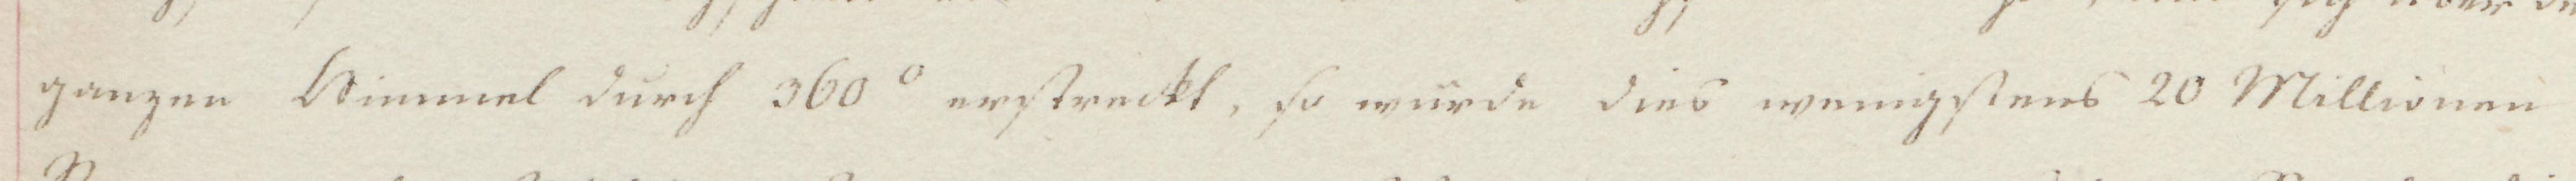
ganzen Himmel durch 360° erstreckt, so würde dies wenigstens 20 Millionen
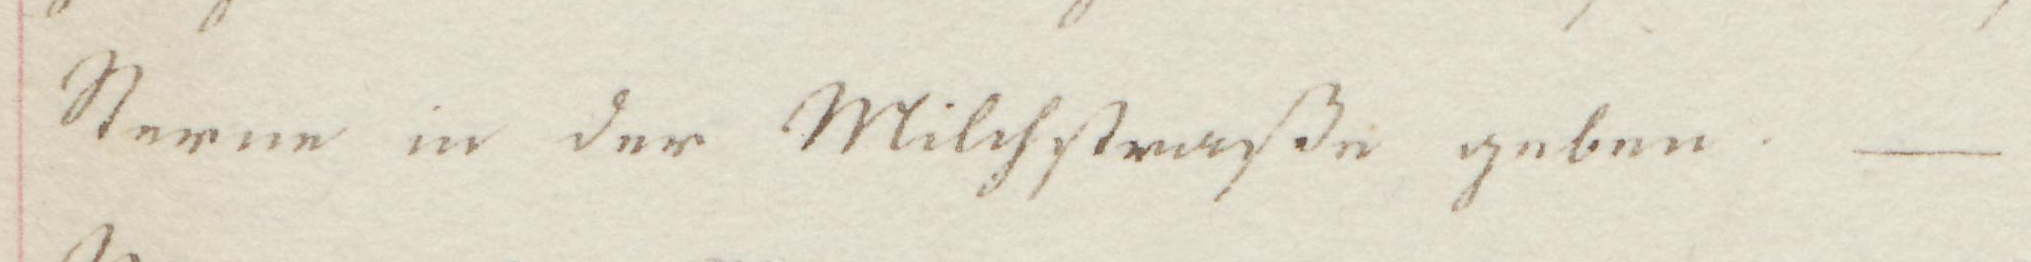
Sterne in der Milchstraße geben. –
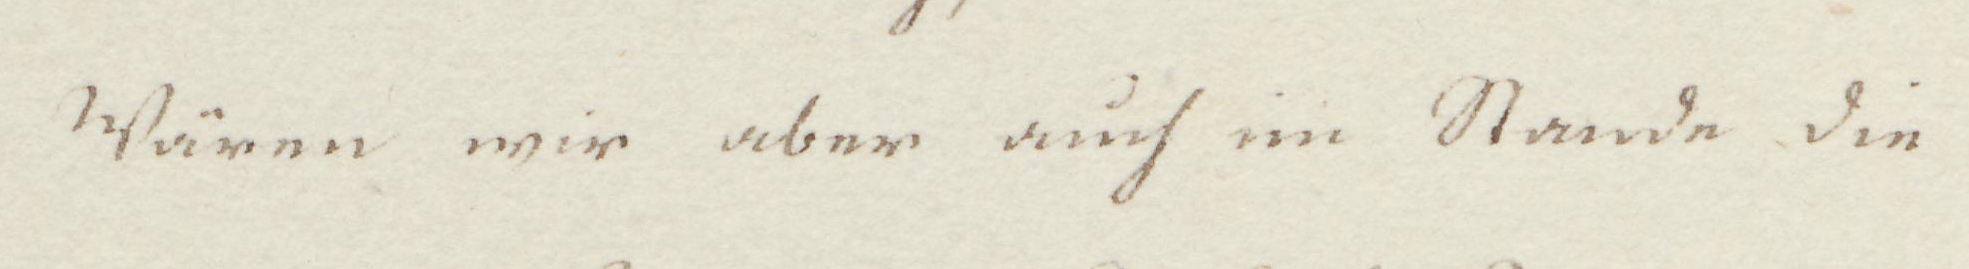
Wären wir aber auch im Stande die
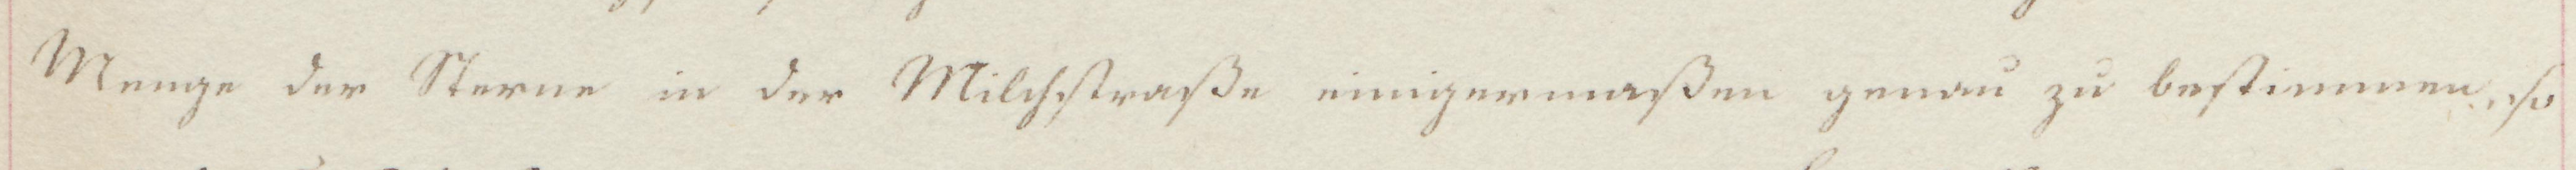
Menge der Sterne in der Milchstraße einigermaßen genau zu bestimmen, so
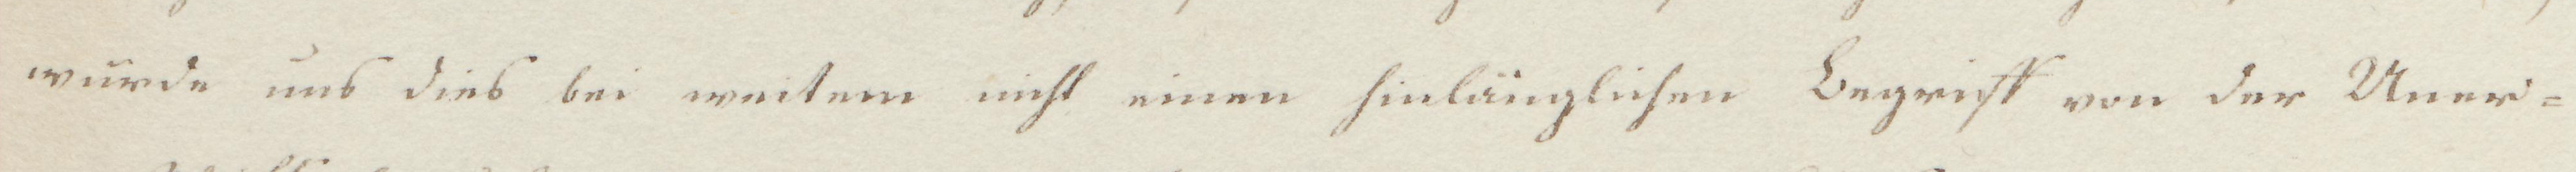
würde uns dies bei weitem nicht einen hinlänglichen Begriff von der Uner-
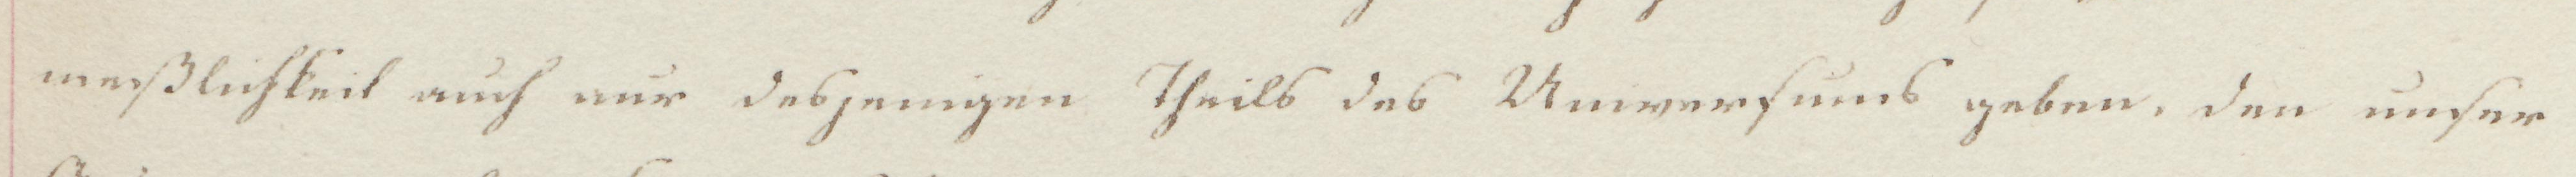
meßlichkeit auch nur desjenigen Theils des Universums geben, den unser
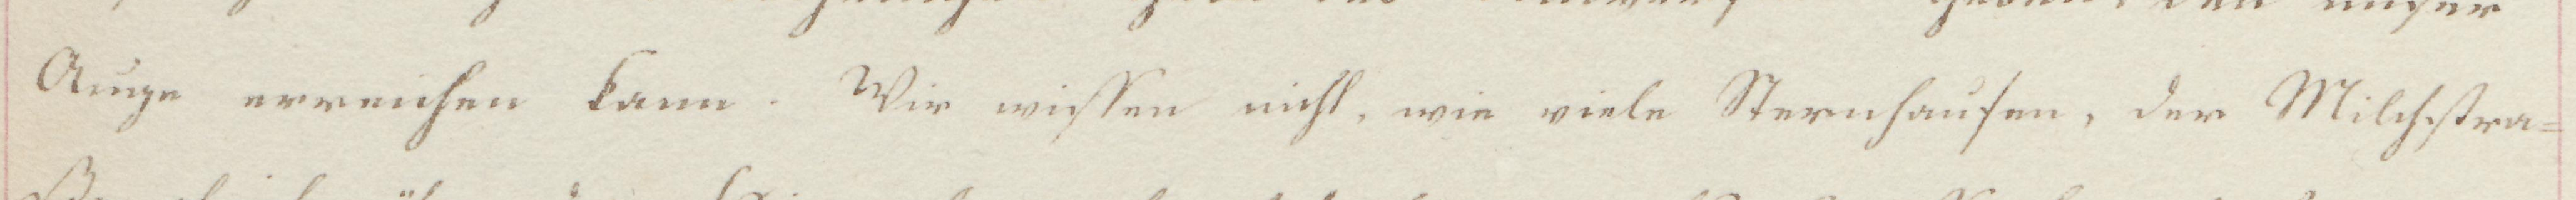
Auge erreichen kann. Wir wissen nicht, wie viele Sternhaufen, der Milchstra-
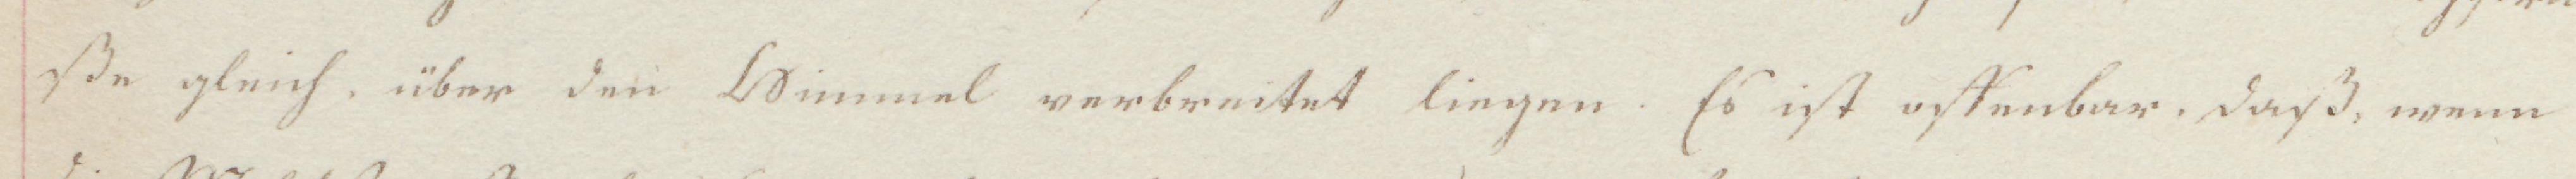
ße gleich, über den Himmel verbreitet liegen. Es ist offenbar, daß, wenn
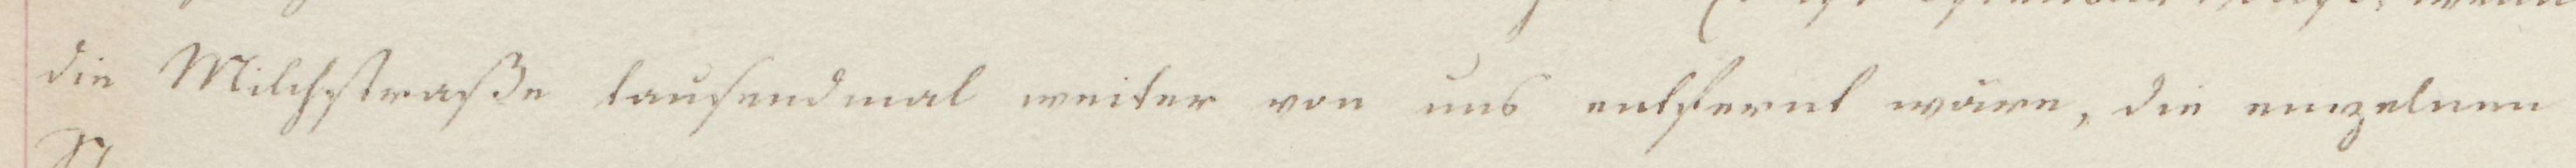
die Milchstraße tausendmal weiter von uns entfernt wäre, die einzelnen
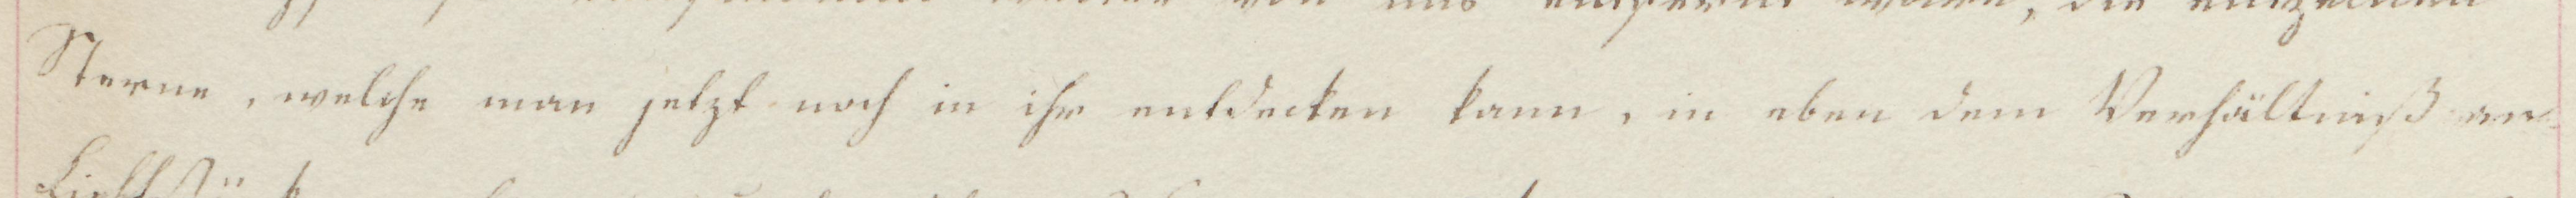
Sterne, welche man jetzt noch in ihr entdecken kann, in eben dem Verhältniß an
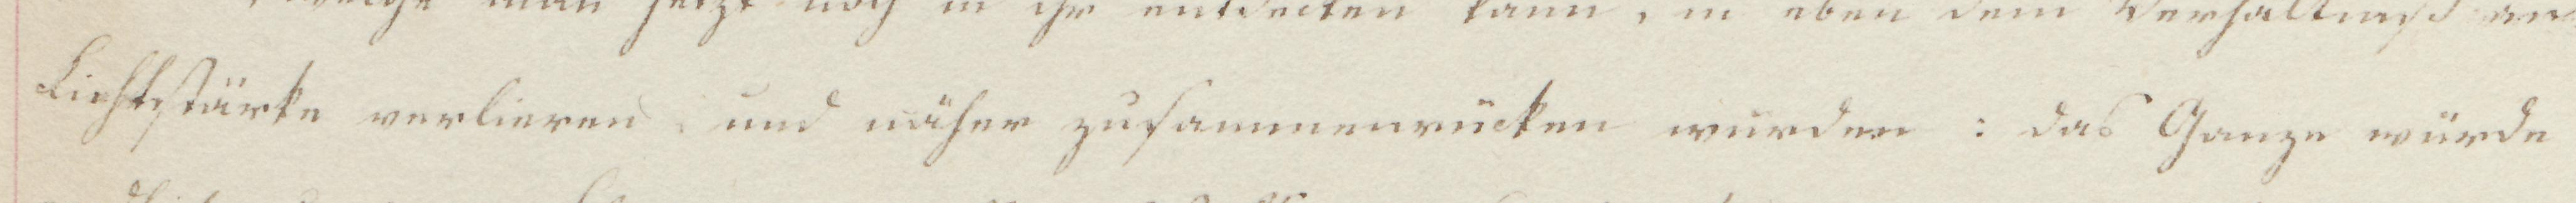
Lichtstärke verlieren, und näher zusammenrücken würden: das Ganze würde
